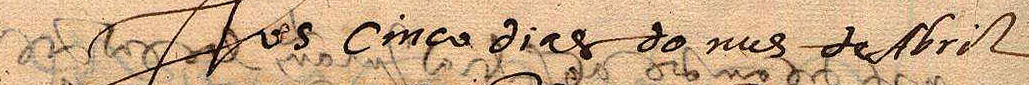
Aos cinco dias do mes de AbriL
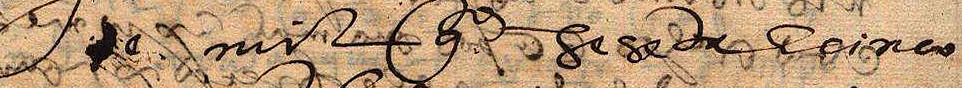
de miL qtos sesēta E cinco
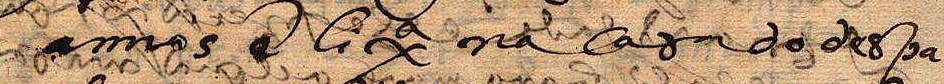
annos ē lixa na casa do despa
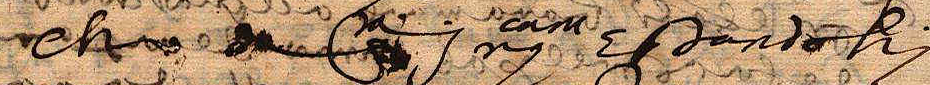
cho da Sta jnqcam Estando hj
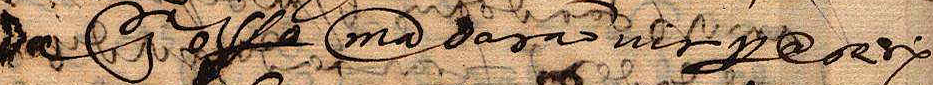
do Sto offo mādaraõ uir ꝑāte sy
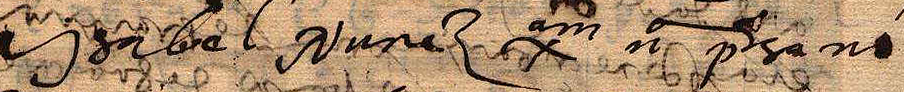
a Jsabel Nunez Xam na p̄sa no
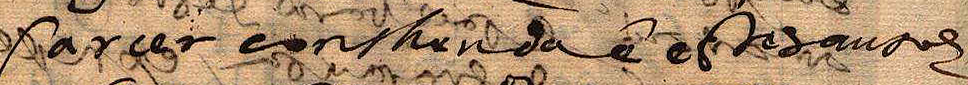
Carcer contheuda ē estes autos
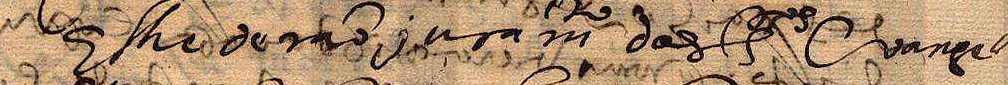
E lhe deraõ juramto dos Stos Evange
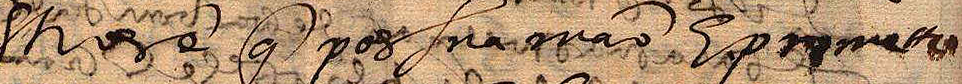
lhos ē q̄ pos sua maõ E prometteo
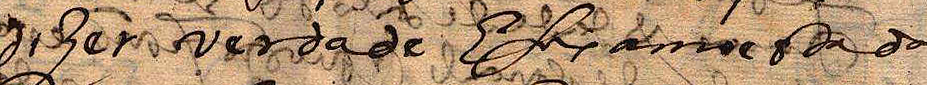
dizer verdade E foi amoestada
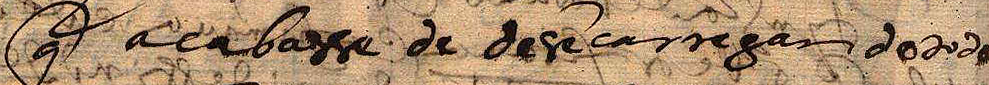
q̄ acabasse de desēcarregar de todo
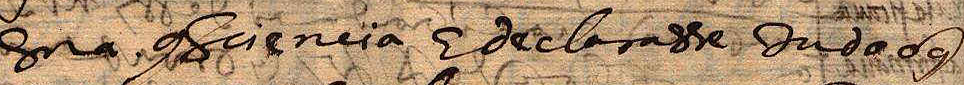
sua ꝯsciencia E declarasse tudo o q̄
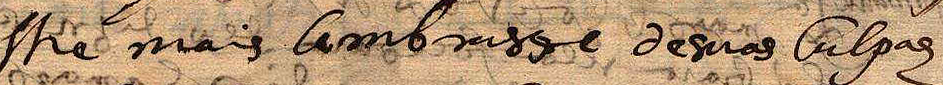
lhe mais lembrasse de suas Culpas
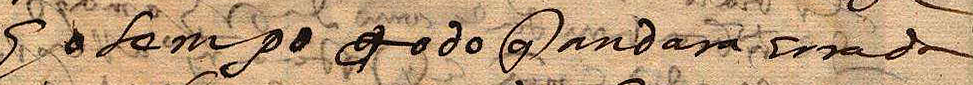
E o tempo todo q̄ andara Errada
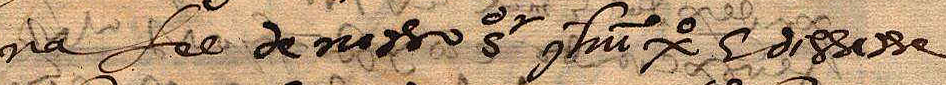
na fee de nosso sor jhū xo E dissesse
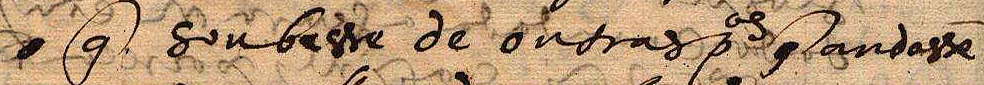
o q̄ soubesse de outras pas q̄ andassē
